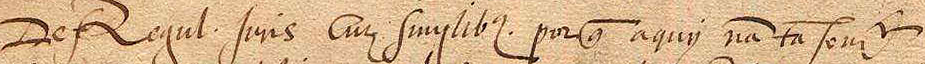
De Regul. Juris Cum Simjlibꝯ porq̄ aquy n̄a tā somte
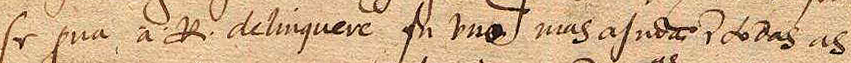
se ꝓua a .R. delinquere Jn vno mas aJnda ē todas as
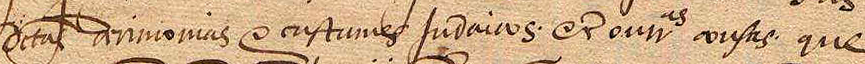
dc̄tas cerimonias e custumes Judaicos. e ē outras cousas que
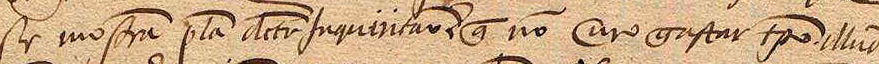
se mos̄tra p̄la dc̄ta Jnquirição ē q̄ nō Curo gastar t̄po illud
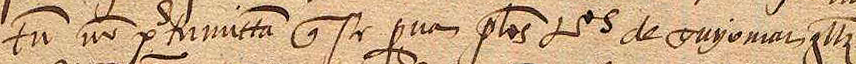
tū n̄o p̄termittā q̄ se ꝓua p̄los tos de guyomar ḡllz
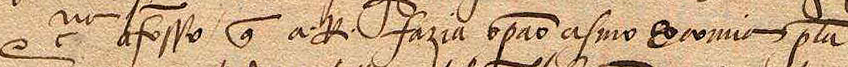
e cna af̄osso q̄ a .R. fazia o pão asmo E o comia p̄la
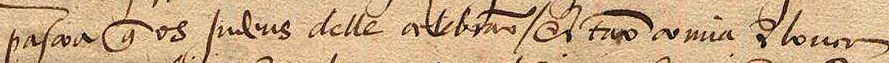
pascoa q̄ os Judeus delle celebrão / e ētão comia ē louça
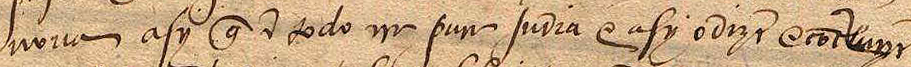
noua asy q̄ ē todo era pura Judia e asy o dizē e c̄ocluyē
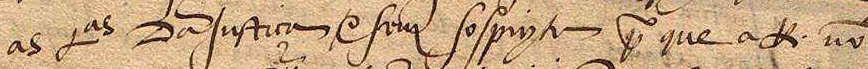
as tas Da Justiça e sem sospeyta p̄oque a Re n̄o
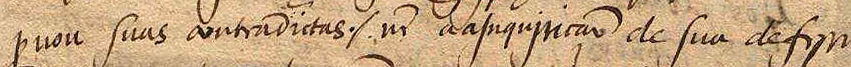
ꝓuou suas contradictas./ nē aa Jnqujrição de sua defesa
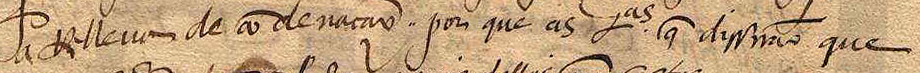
a Relleua de c̄odenação porque as tas q̄ disserão que
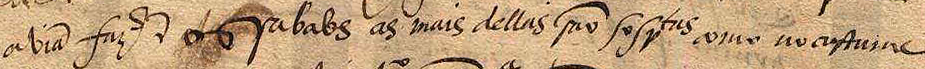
a viā faz̄ ē os sabados as mais dellas são sosptas como no custume
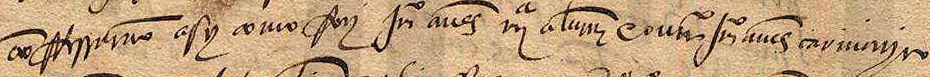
c̄offessarão asy como foy Jmo an̄es ma al̄urez e outro Jmo an̄es carniceyro
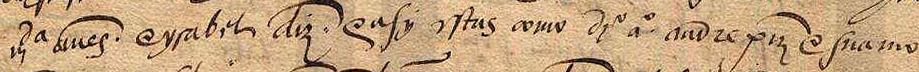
mda an̄es. e ysabel d̄iz e asy estas como djo ao andre pīz e sua mo
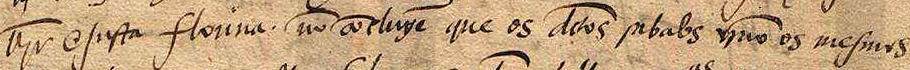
lh̄r e Justa florina n̄o c̄ocluyē que os d̄ctos sabados erão os mesmos
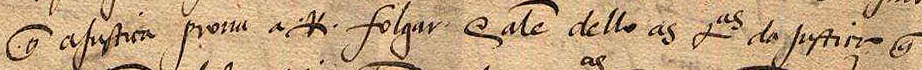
q̄ a Justica proua a .R. folgar e alē dello as tas da Justiça q̄
